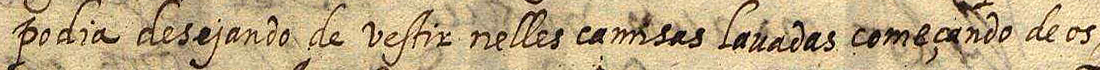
podia desejando de vestir nelles camisas lauadas começando de os
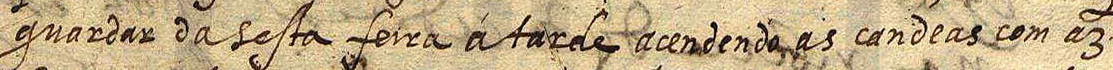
guardar da sesta feira á tarde acendendo as candeas com azte
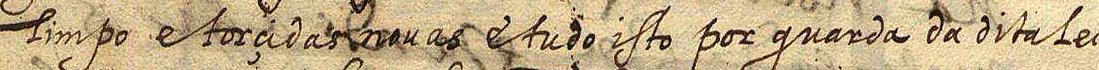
limpo e torçidas nouas e tudo isto por guarda da dita lei
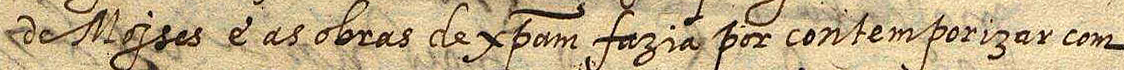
de Mojses e as obras de xpām fazia por contemporizar com
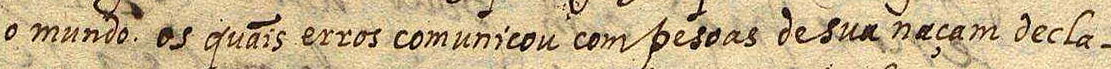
o mundo os quāis erros comunicou com pesoas de sua naçam decla
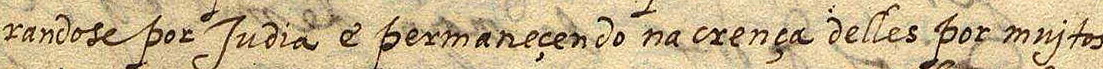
randose por Judia e permaneçendo na crença delles por mujtos
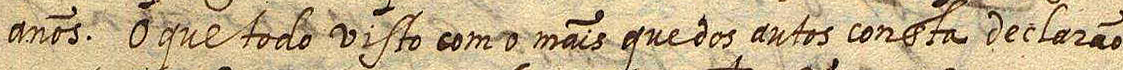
anōs. O que todo visto com o māis que dos autos consta declarão
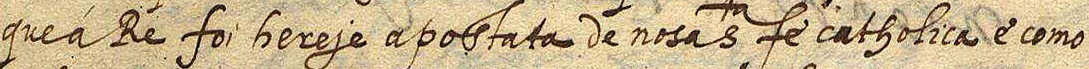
que a Re foi hereje apostata de nosa sta fe catholica e como
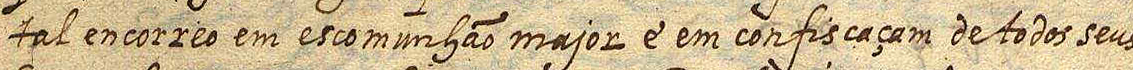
tal encorreo em escomunhaõ major e em confiscaçam de todos seus
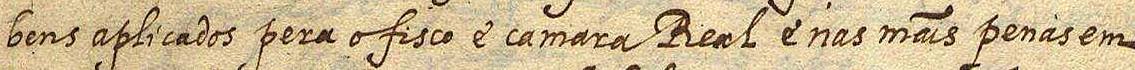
bens aplicados pera o fisco e camara Real e nas māis penas em
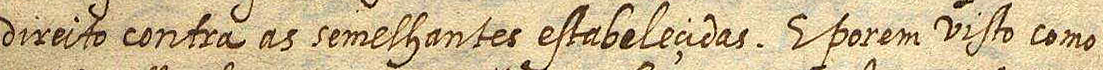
direito contra as semelhantes estabeleçidas. E porem visto como
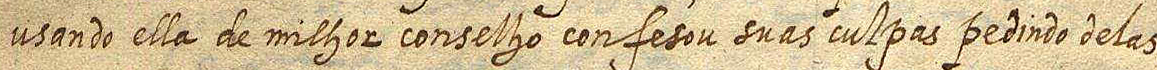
usando ella de milhor conselho confesou suas culpas pedindo delas
